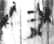凡
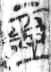坪（平）
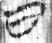日
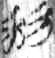利（利）
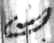㠯（以）
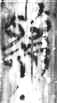祭
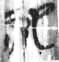祀
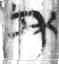和
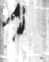人
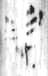民
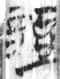○（屬）
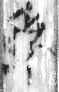事
